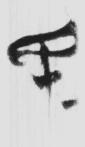民
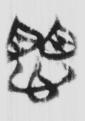{䀠心}
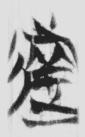{辶止㚔}
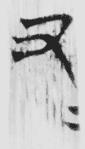又=
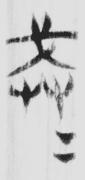戒=
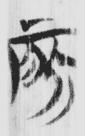所
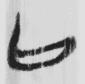㠯（以）
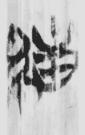{糸屮田}
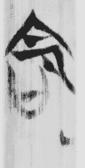命
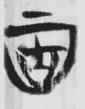固
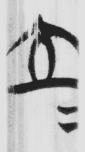立=
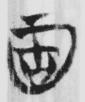固
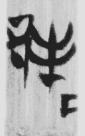邦=
